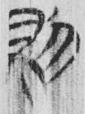則
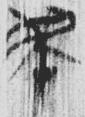民
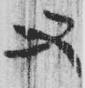又（有）
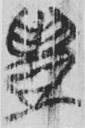豊（禮）
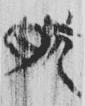肰（然）
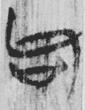后（後）
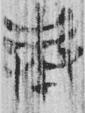奉
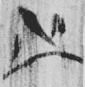之
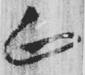㠯（以）
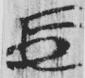𠁩
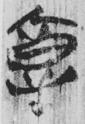○（準庸○）
